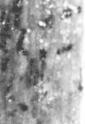之
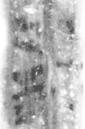日
